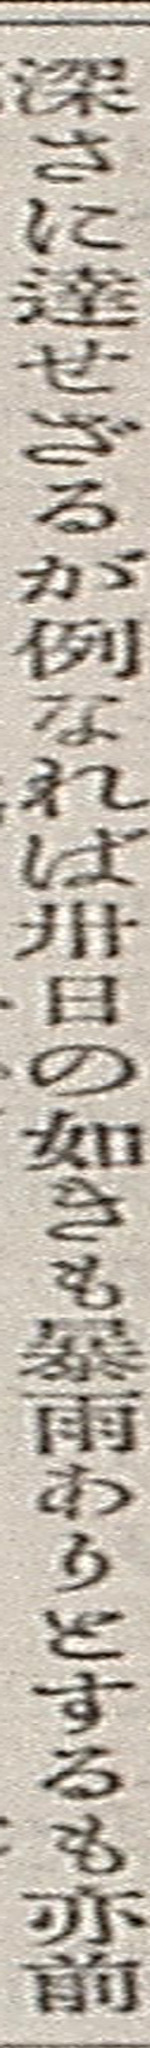深さに達せざるが例なれば卅日の如きも暴風ありとするも亦前
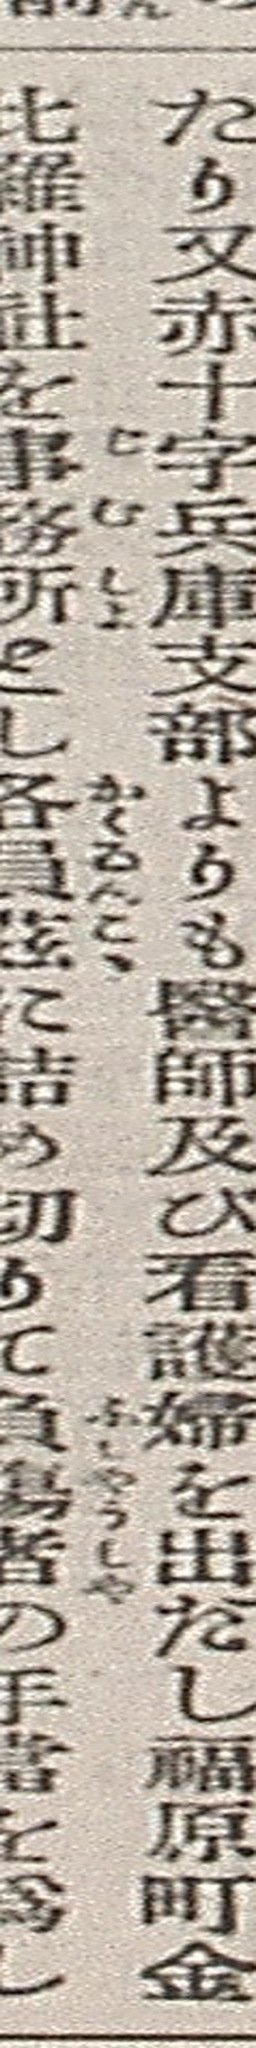比羅神社を事務所とし各員玆に詰切りて負傷者の手当うを為し
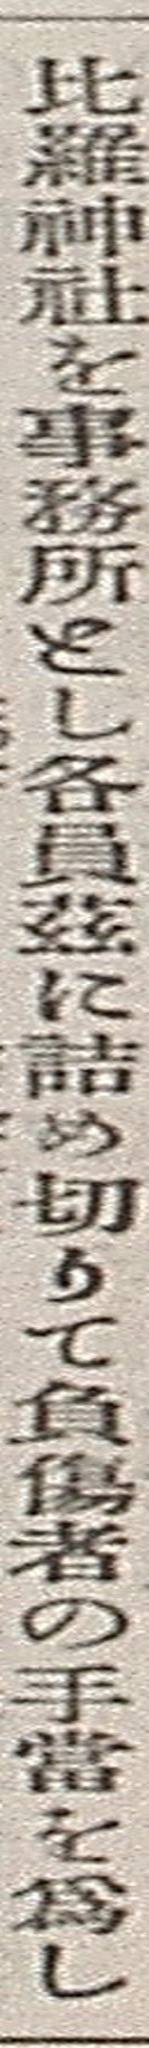比羅神社を事務所とし各員玆に詰切りて負傷者の手当うを為し
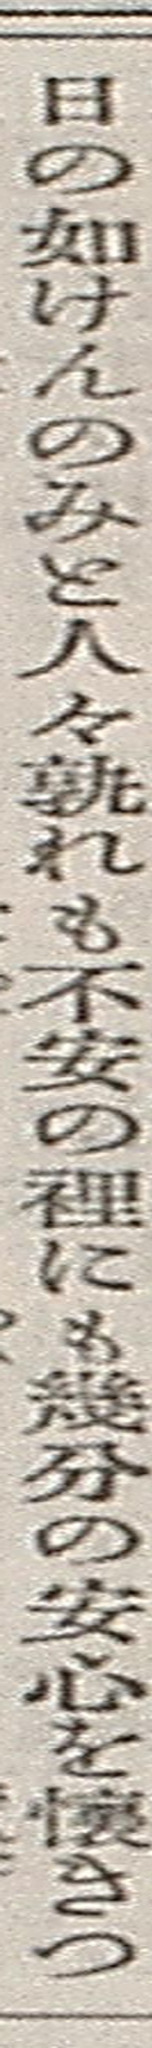日の如けんのみと人々孰れも不安の裡にも幾分の安心を懐きつ
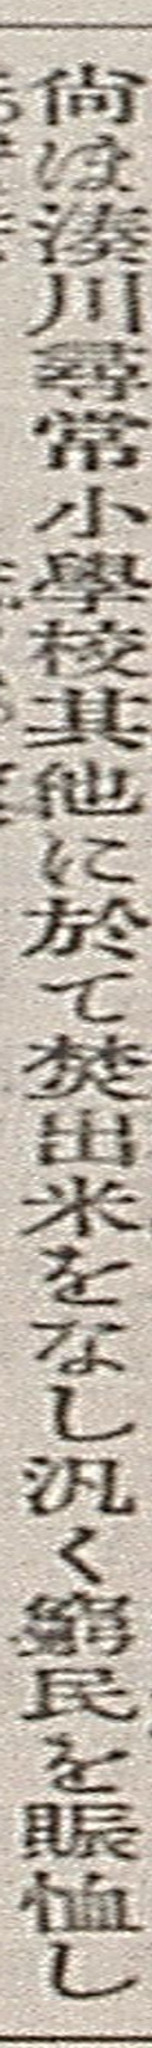尚ほ湊川尋常小学校其他に於て焚出米をなし汎く窮民を賑恤し
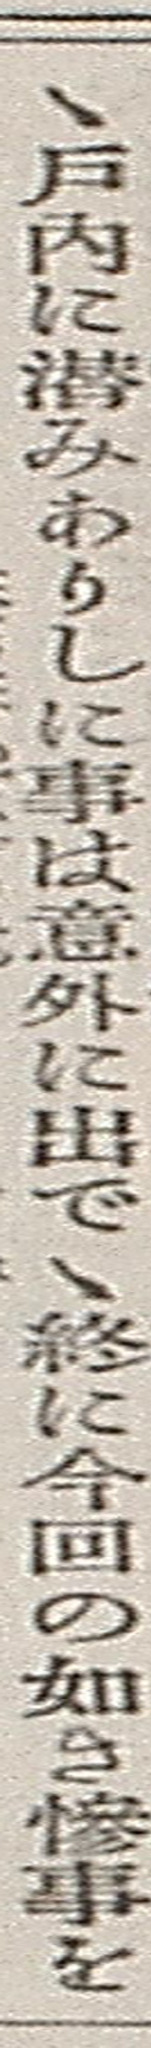ゝ戸外に潜みありしに事は意外に出でゝ終に今回の如き参事を
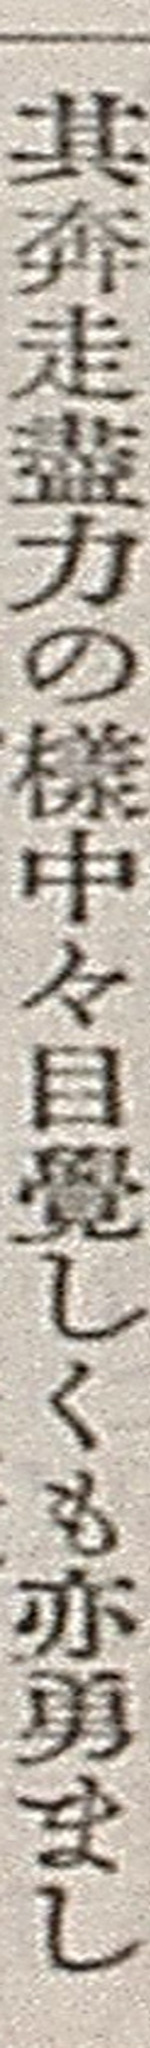其奔走尽力の様中々目覚しくも亦勇まし
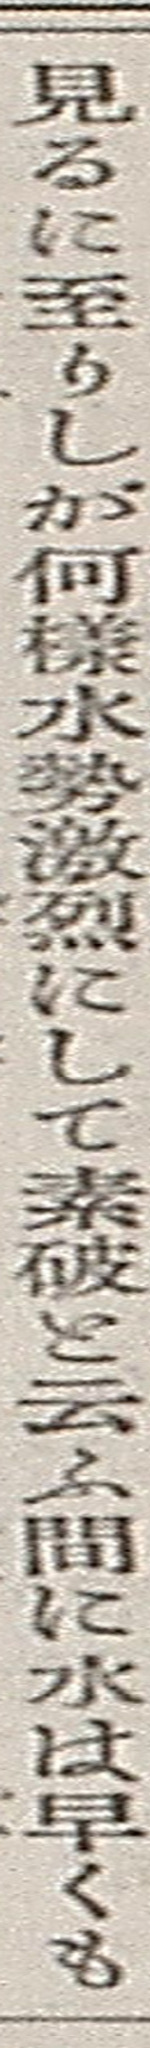見るに至りしが何様水勢激烈にして素破と云ふ間に水は早くも
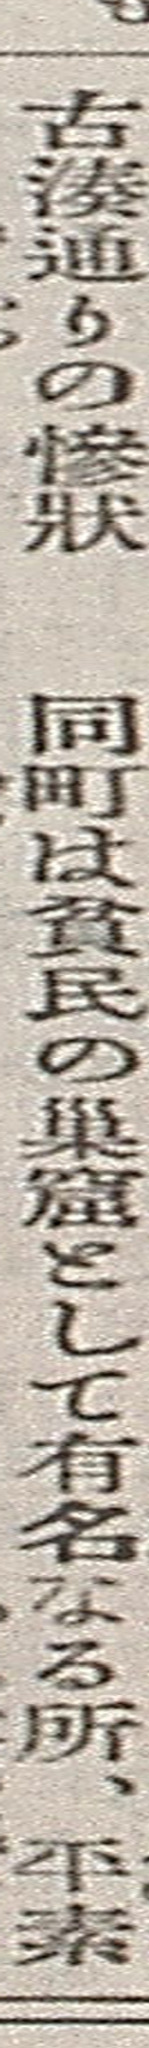古湊通りの惨状同町は貧民の巣窟として有名なる所、平素
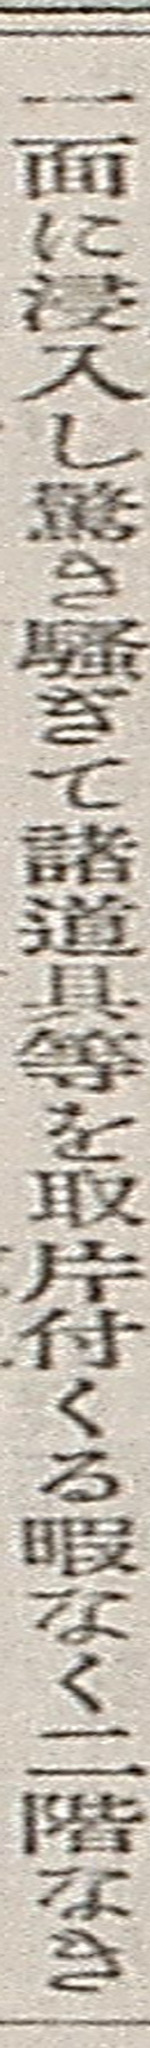一面に侵入し驚き騒ぎて諸道具等を取片付くる暇なく二階なき
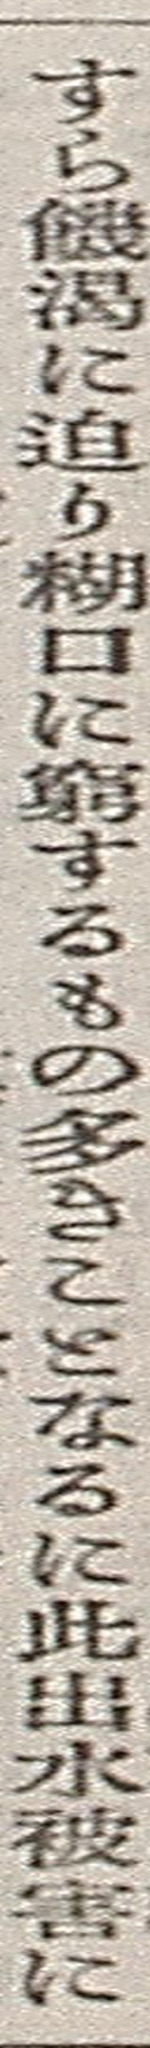すら飢渇に迫り糊口に窮するもの多きことなるに此出水被害に
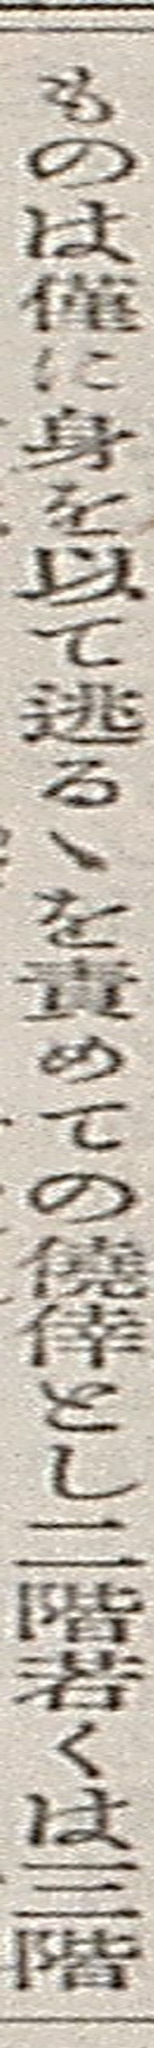ものは僅に身を以て逃るゝを責めての僥倖とし二階若くは三階
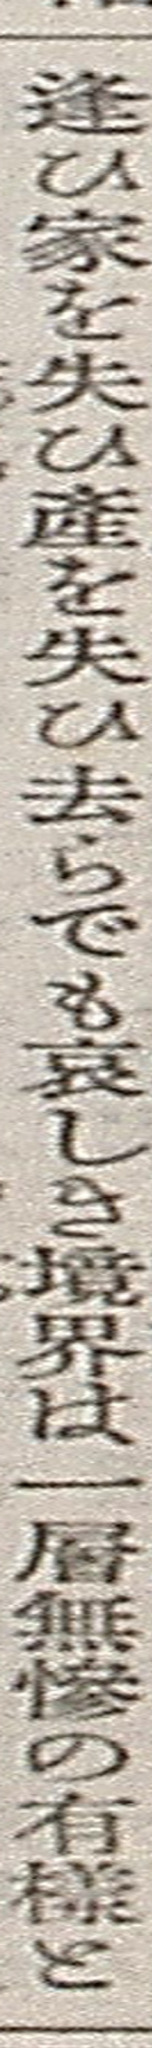逢ひ家を失ひ産を失ひ去らでも哀しき境界は一層無惨の有様と
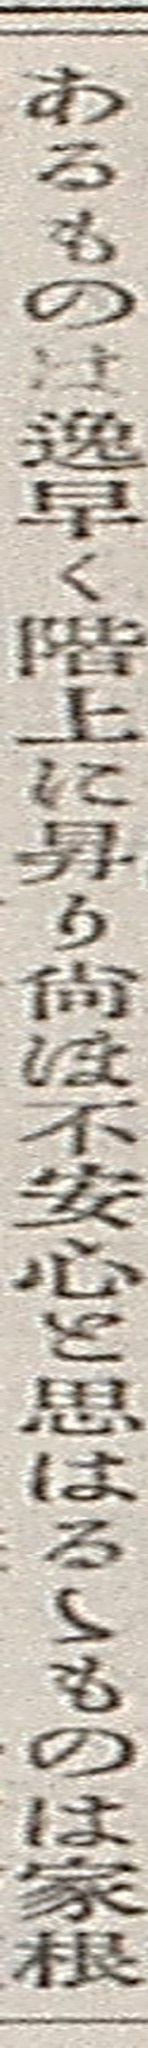あるものは逸早く階上に昇り尚ほ不安心と思はるゝものは家根
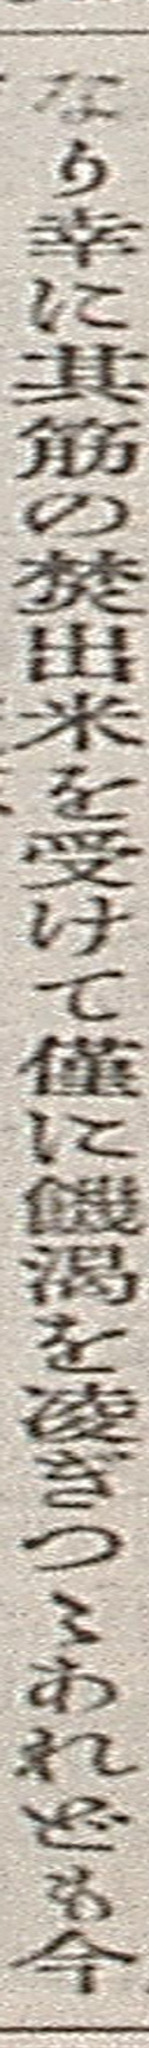なり幸に其筋の焚出米を受けて僅に飢渇を凌ぎつゝあれども今
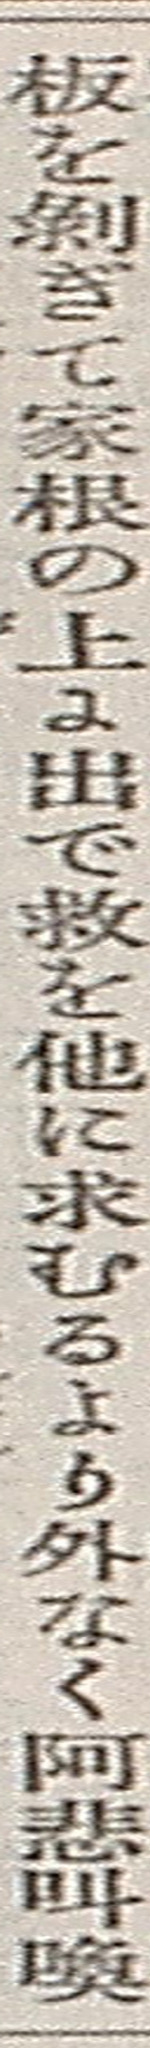板を剥ぎて家根の上に出で救を他に求むるより外なく阿悲叫喚
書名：風俗畫報臨時増刊第百二十八號　洪水被害録（下）
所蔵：東京大学地震研究所図書室 Earthquake Research Institute Library, The University of Tokyo, JAPAN
